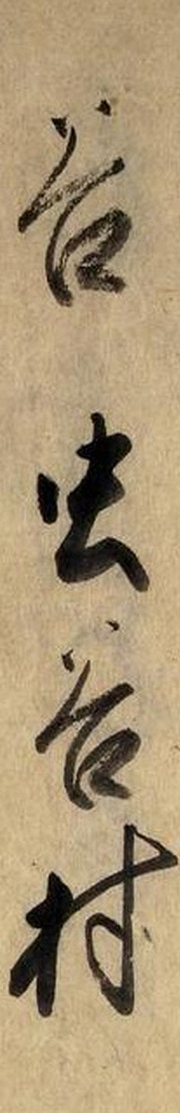谷虫谷村
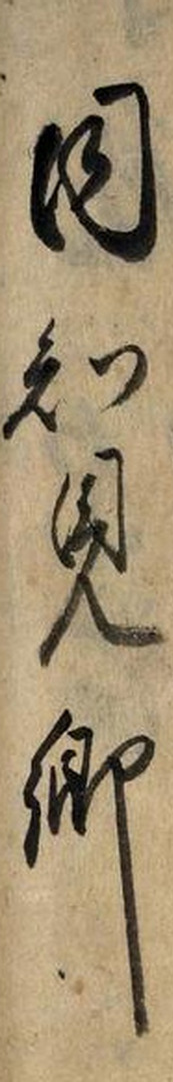同知見郷
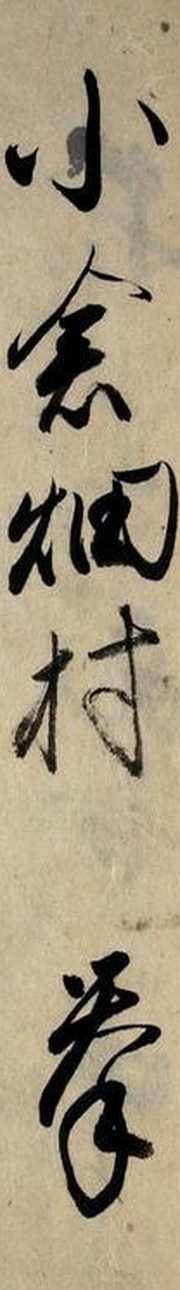小倉畑村挙
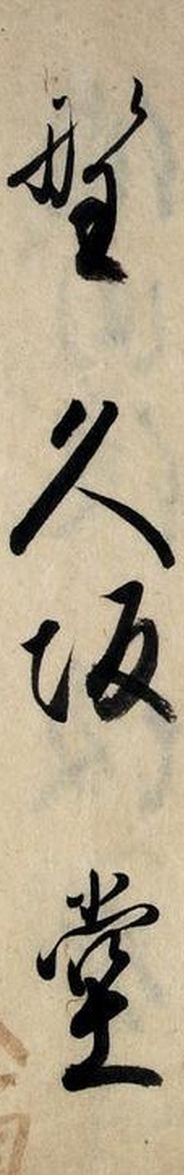野久坂堂
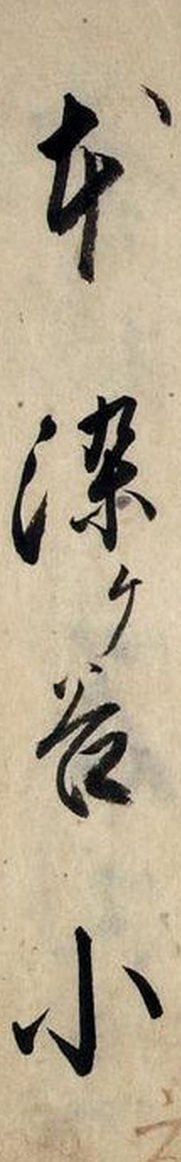本染ヶ谷小

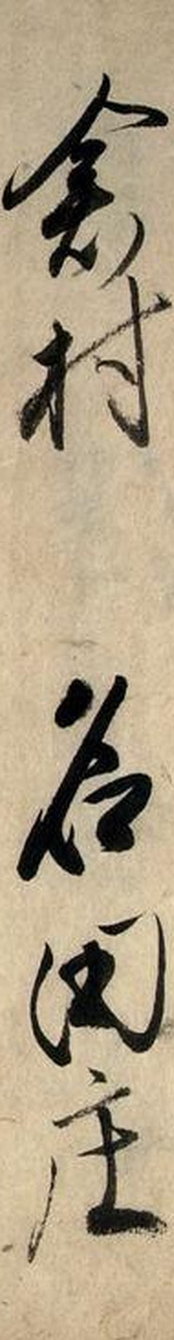倉村名田庄
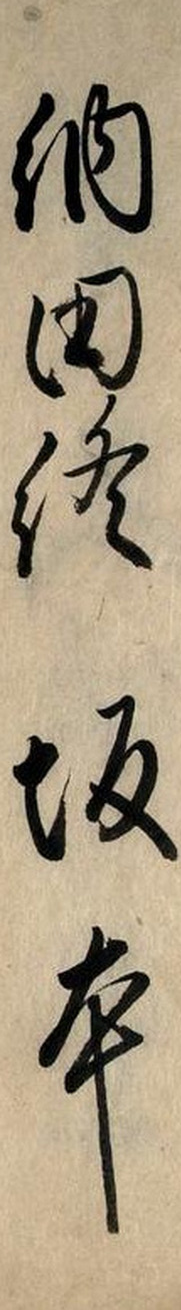納田終坂本
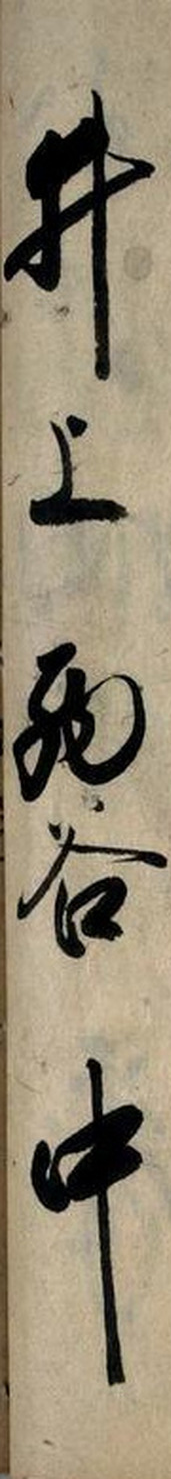井上西谷中
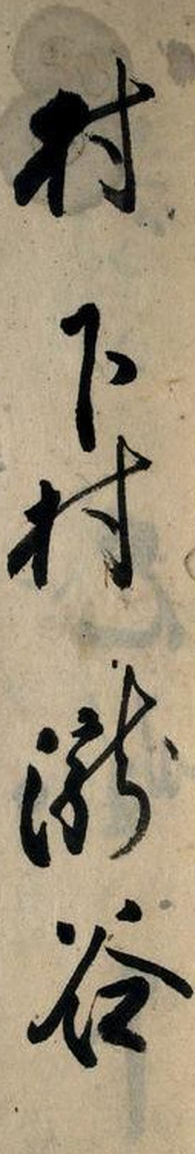村下村瀧谷
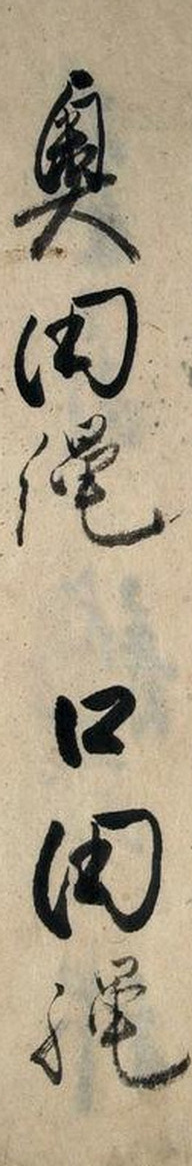奥田縄口田縄
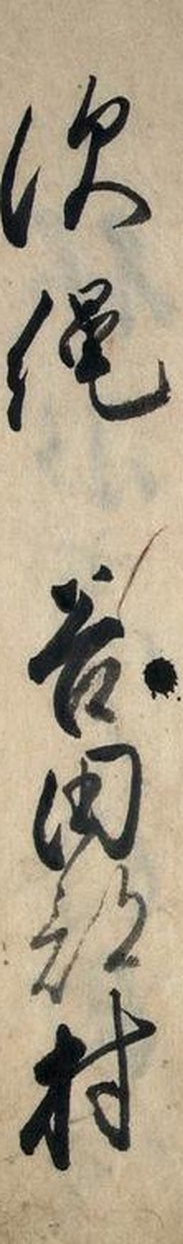須縄谷田部村

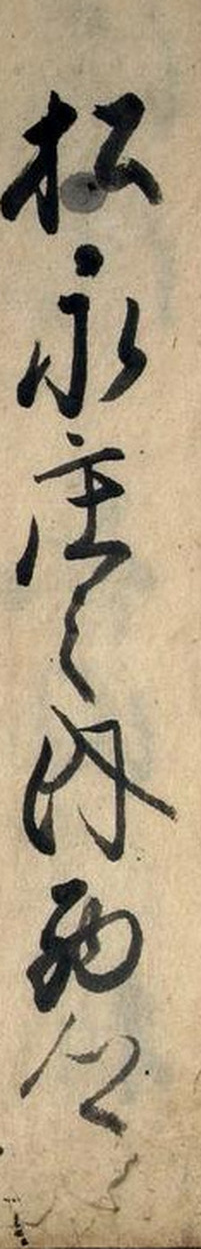松永庄之内西郷
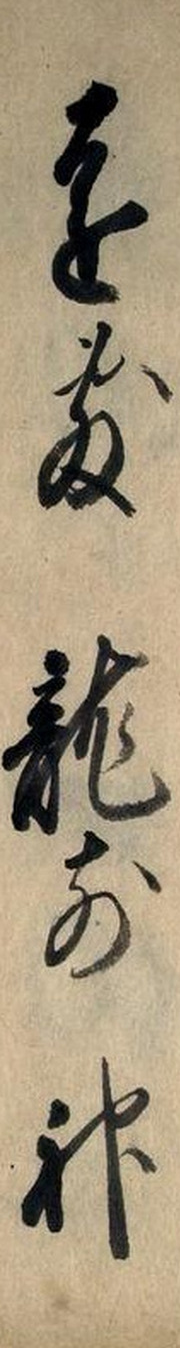遠敷龍前神
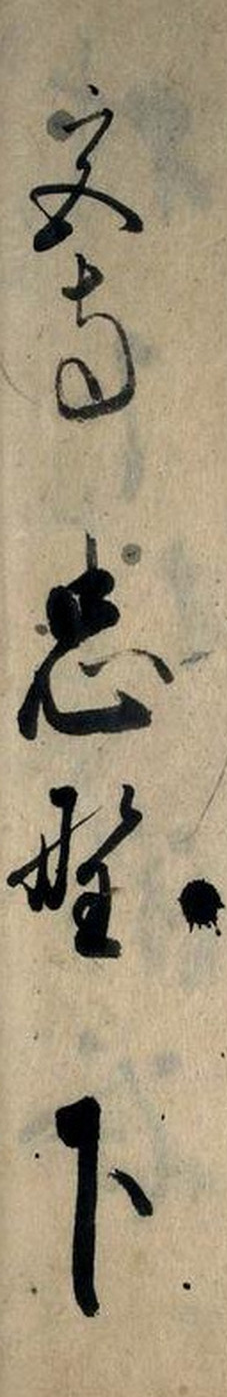宮寺忠野下
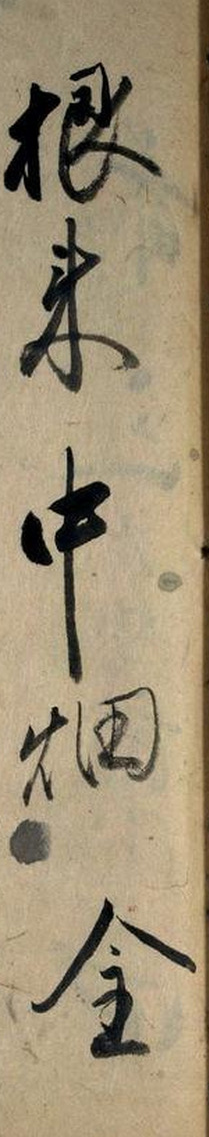根来中畑金
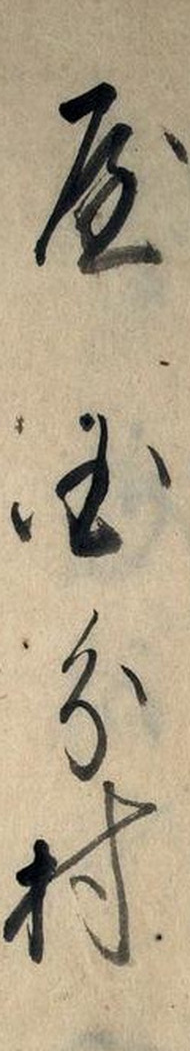屋国分村
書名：御手本（手習、家号之事、小浜商家の屋号）
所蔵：福井県文書館 Fukui Prefectural Archives
